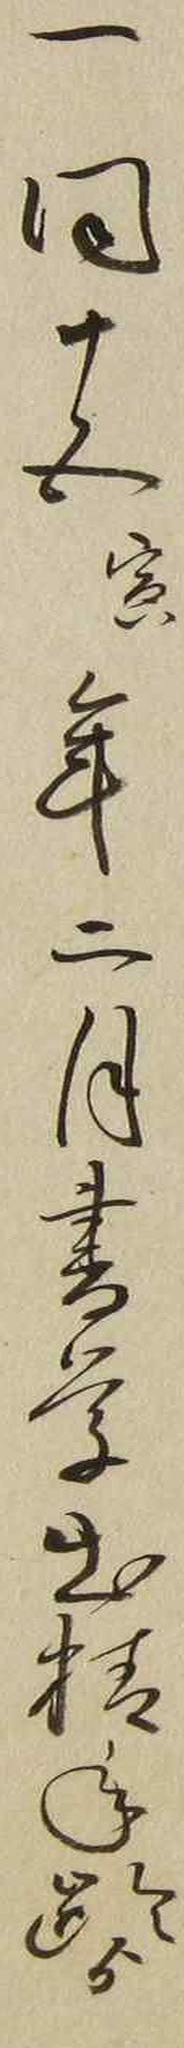一同十五寅年二月書学出精年齢ゟ

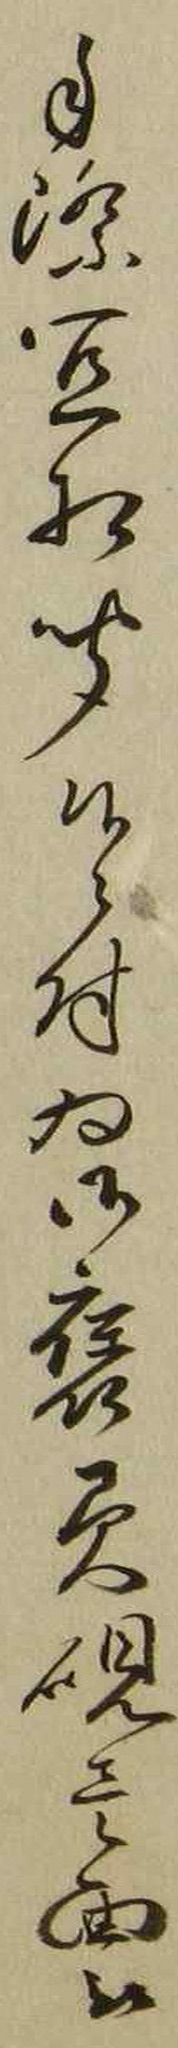手際宜相聞候に付為御褒美硯壱面被
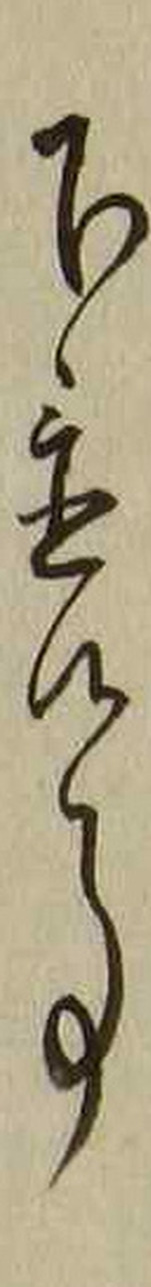下置候事
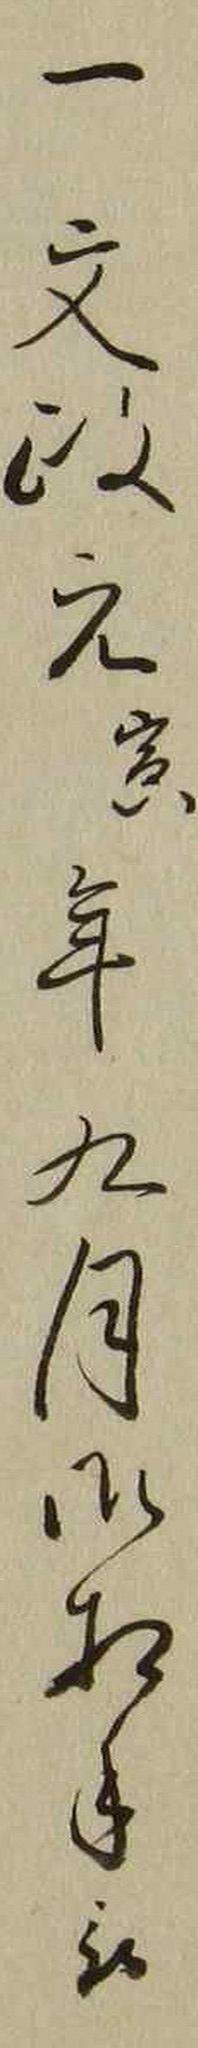一文政元寅年九月御相手被
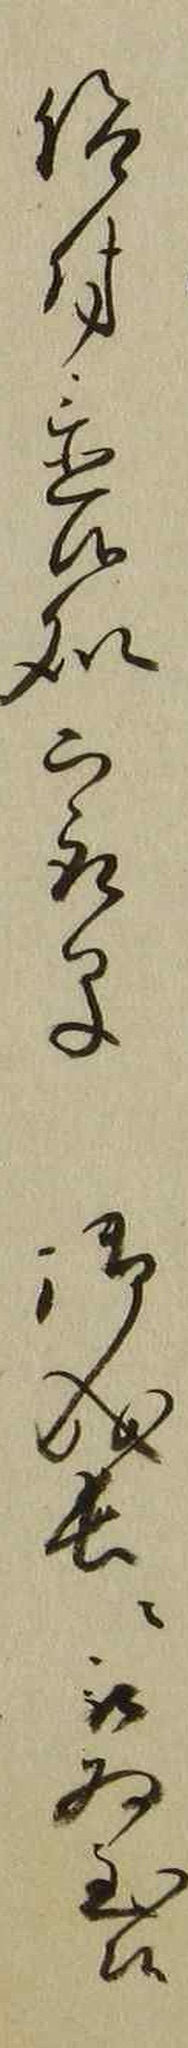仰付置候処取御成長に被為至候
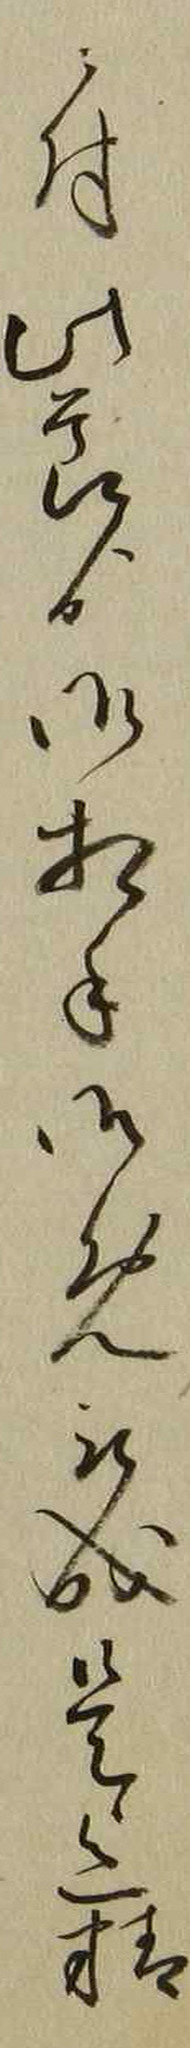に付此節ゟ御相手御免被成是迄精
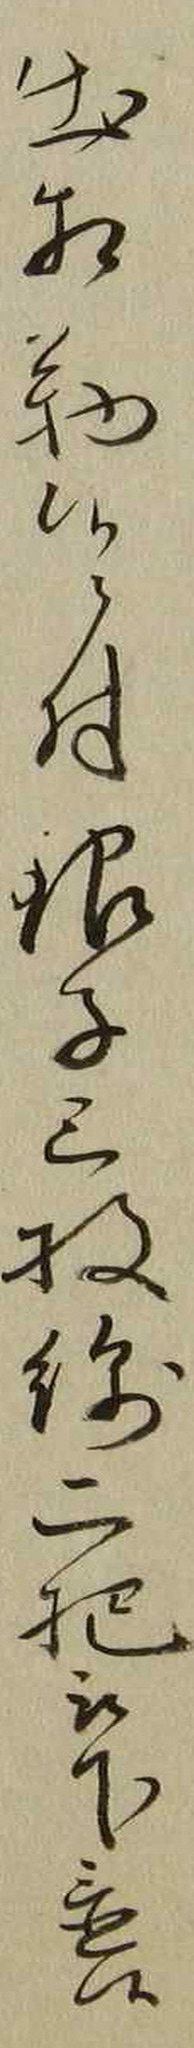出相勤候に付銀子三枚綿二把下置候
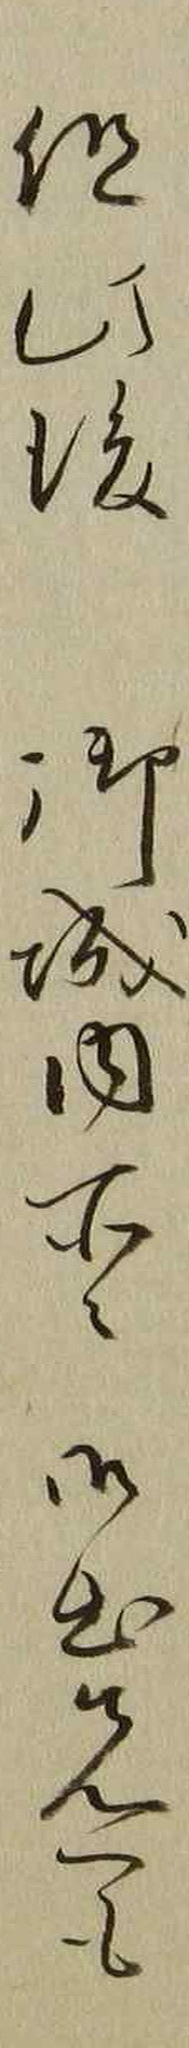但此後御城内所々御出先へも
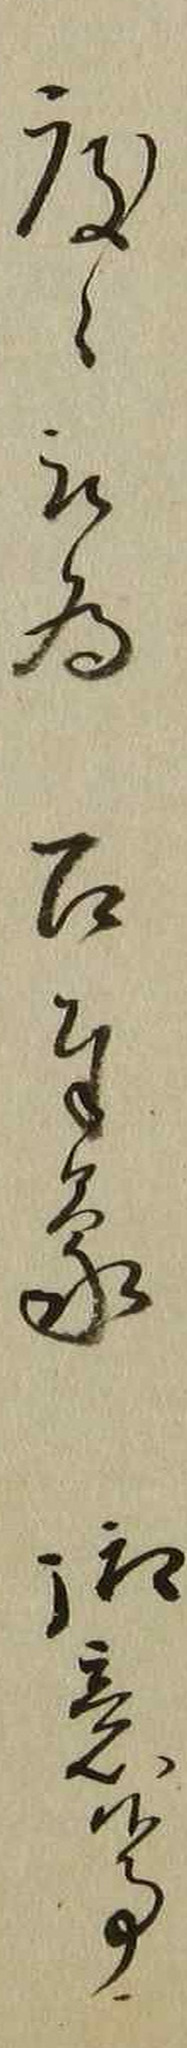度々被為召連蒙御意候事
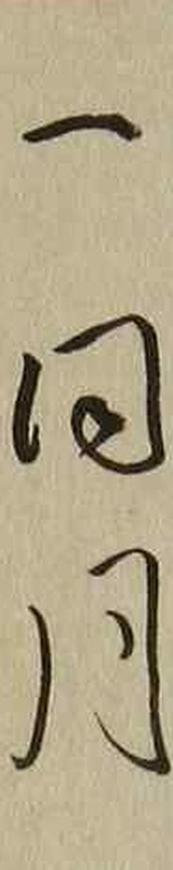一同月
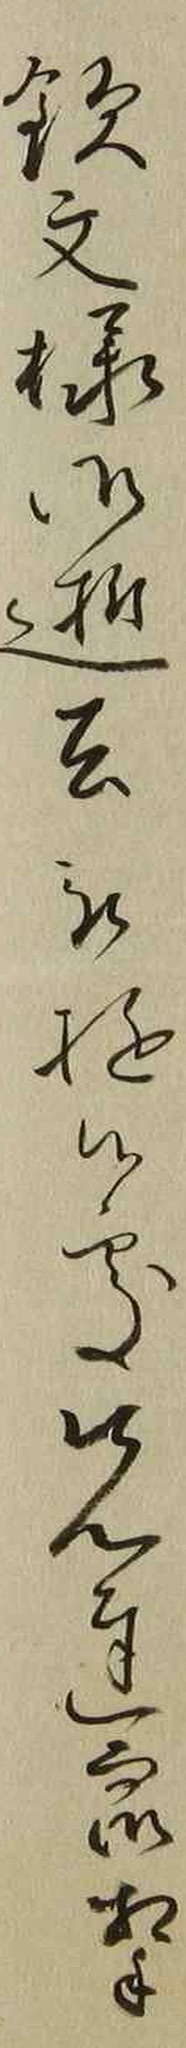欽文様御逝去被遊候処先達而御相手
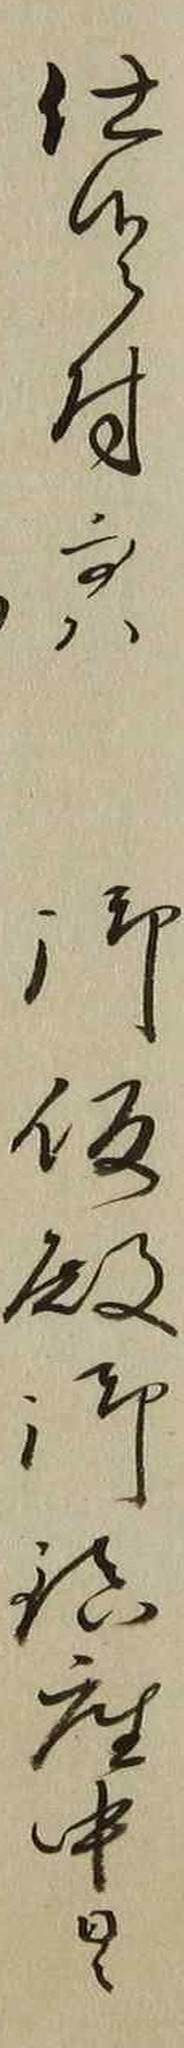仕候に付而は御仮殿御鎮座中日々
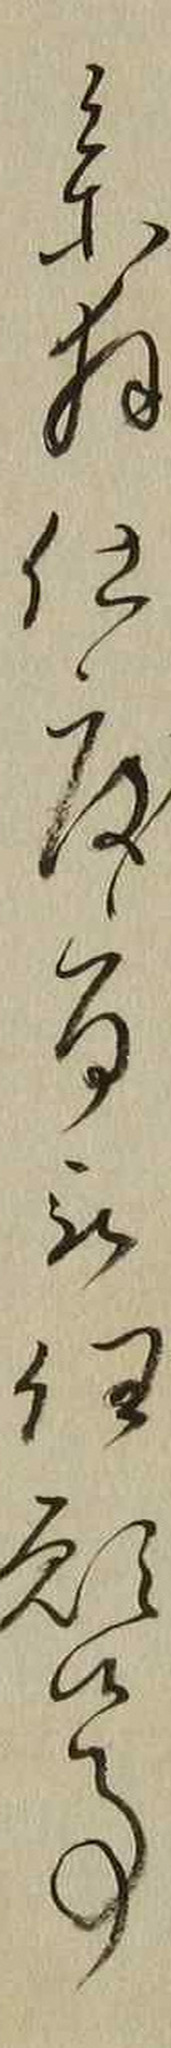参拝仕度旨被任願候事
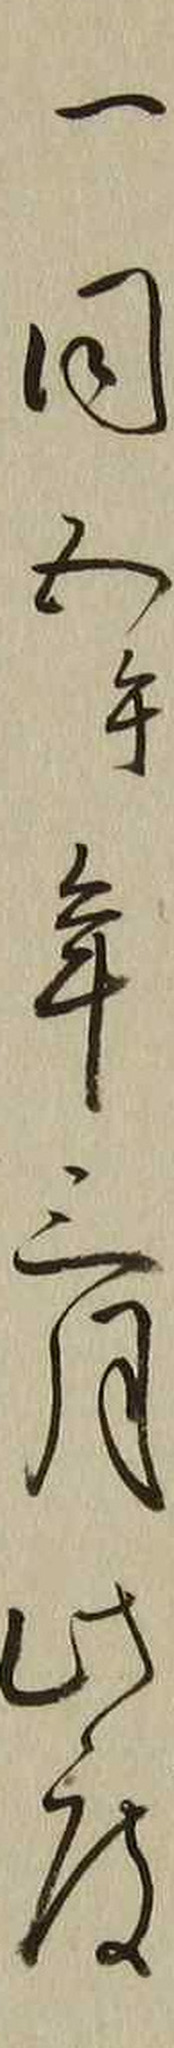一同五午年三月此度
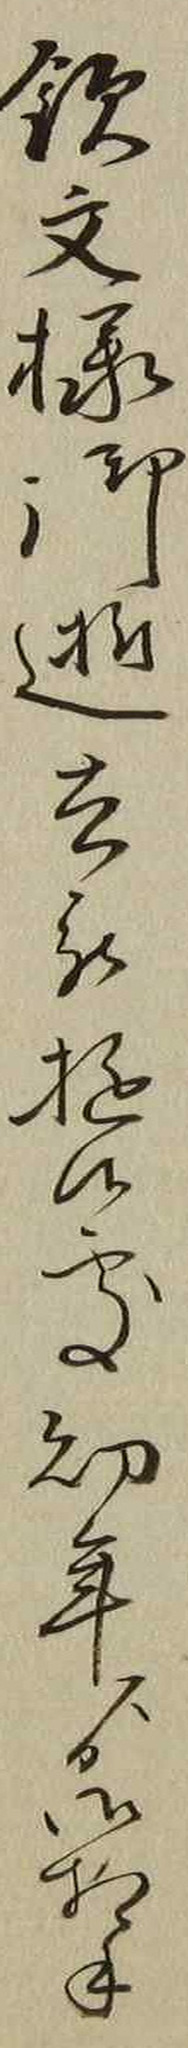欽文様御逝去被遊候処幼年ゟ御相手
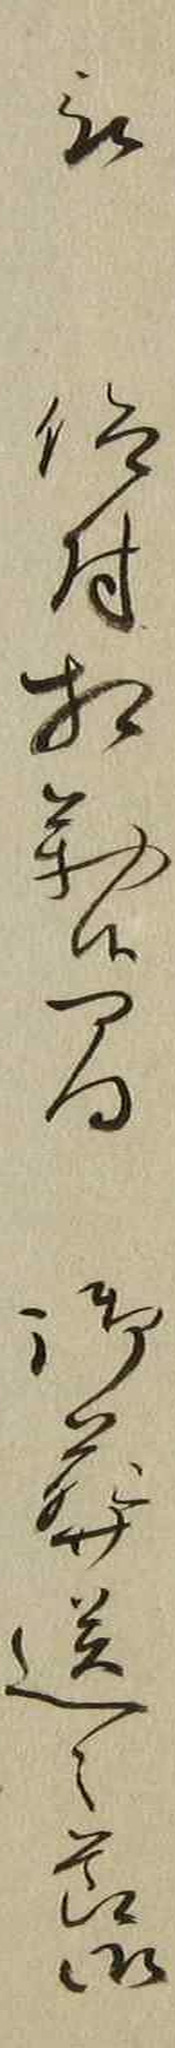被仰付相勤候間御葬送之節御
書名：諸士系譜　巻之3　い之部3
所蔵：会津若松市立会津図書館
